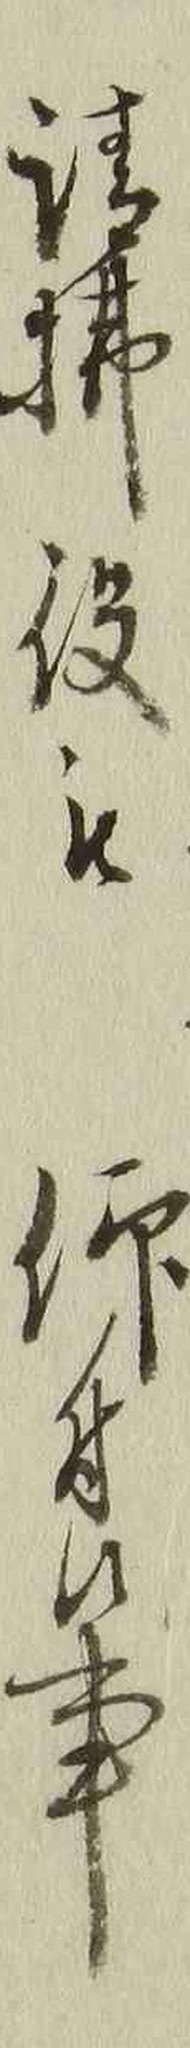請払役被仰付候事
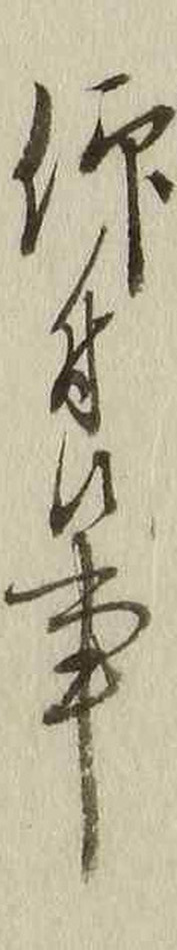仰付候事
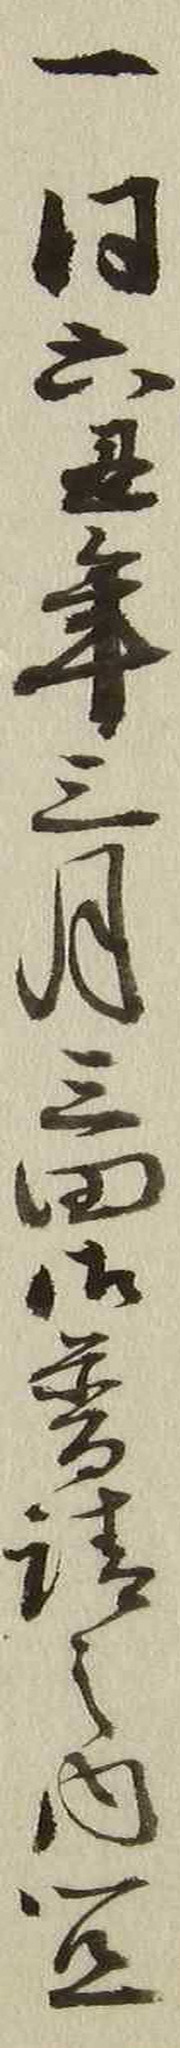一同六丑年三月三田御普請之内宜
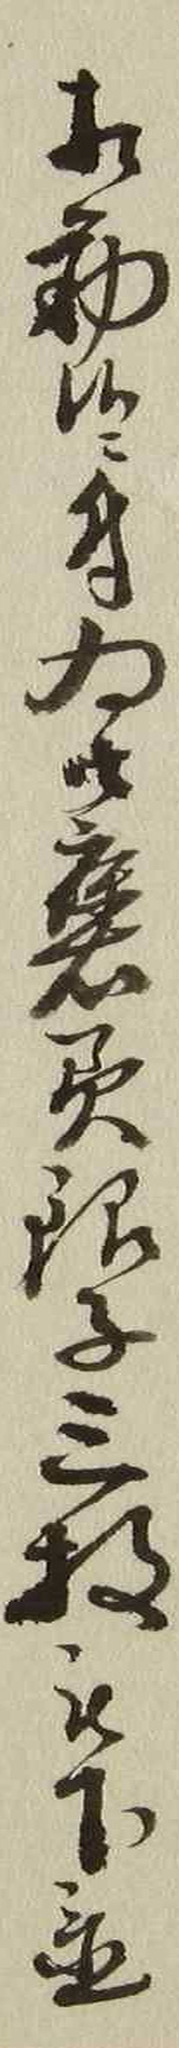相勤候ニ付為御褒美銀子三枚被下置
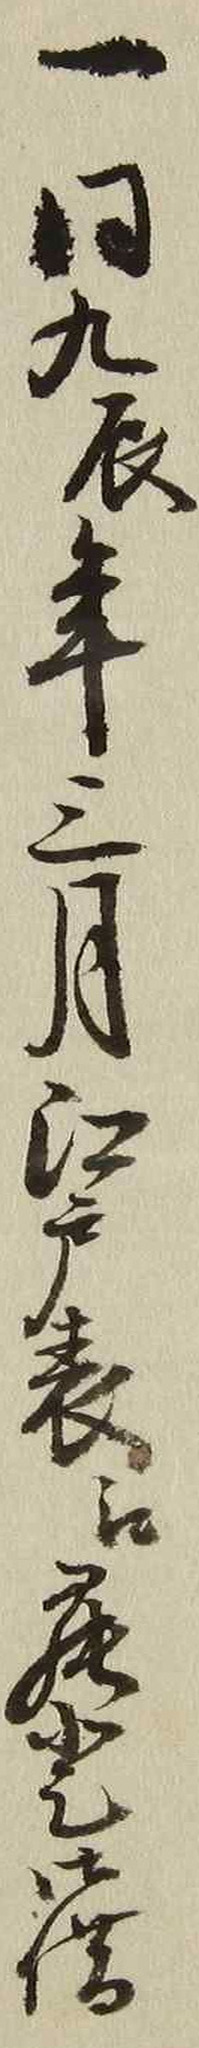一同九辰年三月江戸表江罷登御借
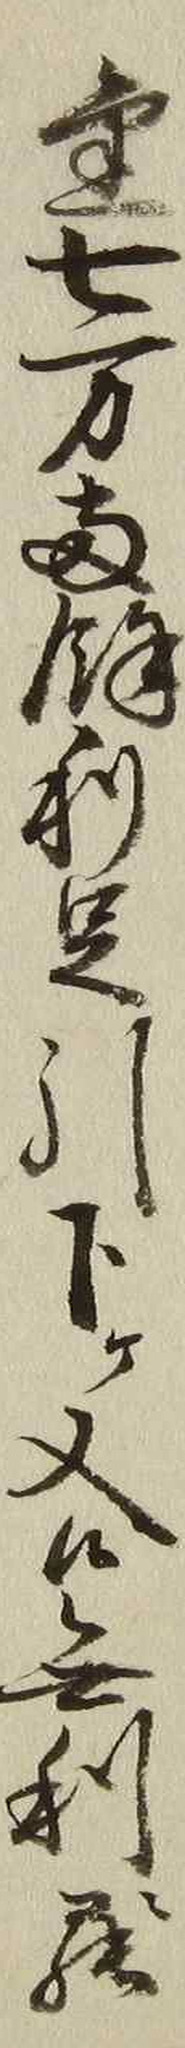金七万両余利足引下ケ又候無利ニ罷
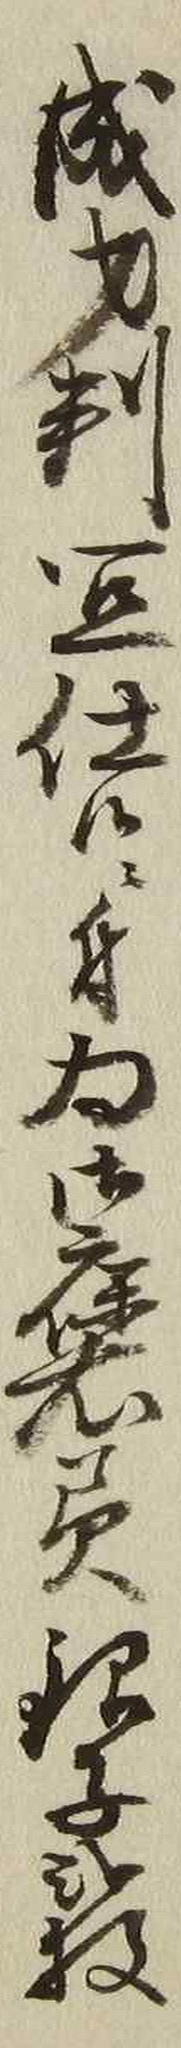成才判宜仕候ニ付為御褒美銀子弐枚
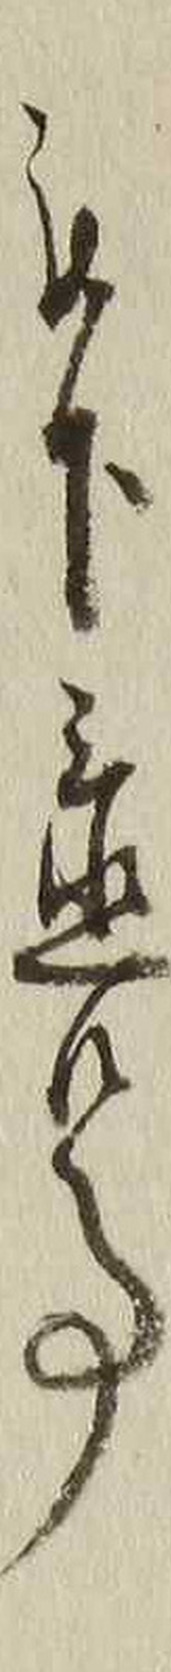被下置候事
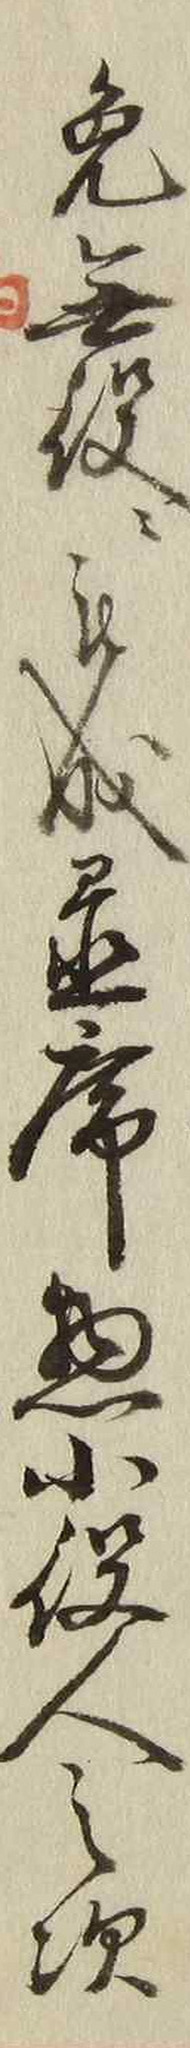免無役ニ被成置席惣小役人之次
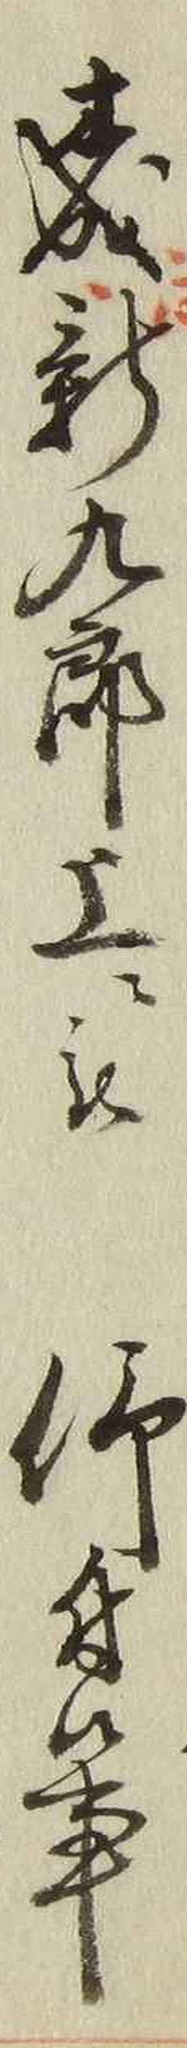森新九郎上ニ被仰付候事
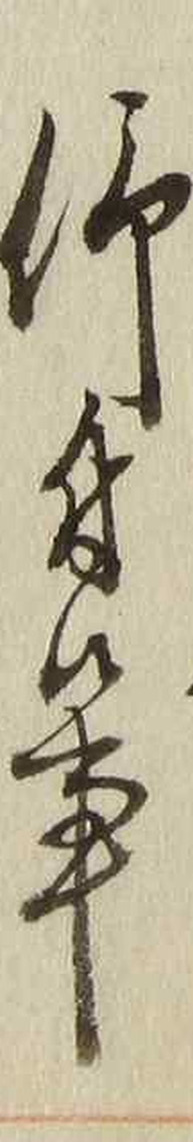仰付候事
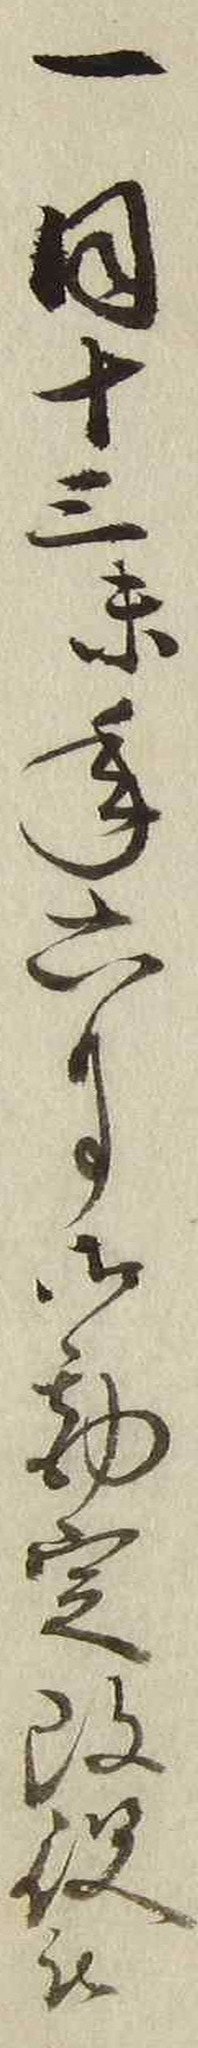一同十三未年六月御勘定改役被
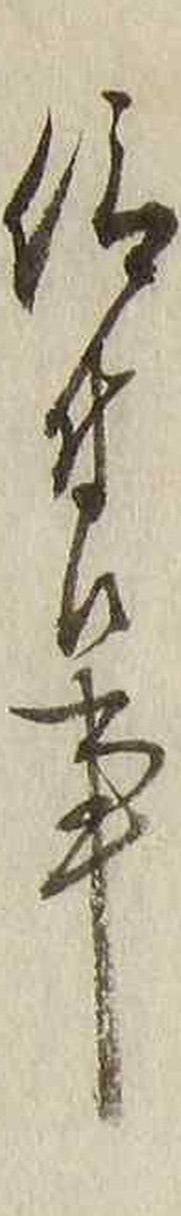仰付候事

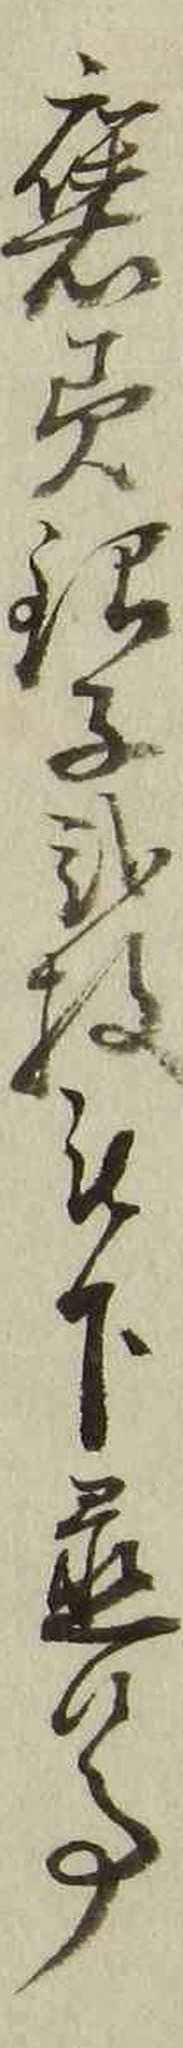褒美銀子弐枚被下置候事
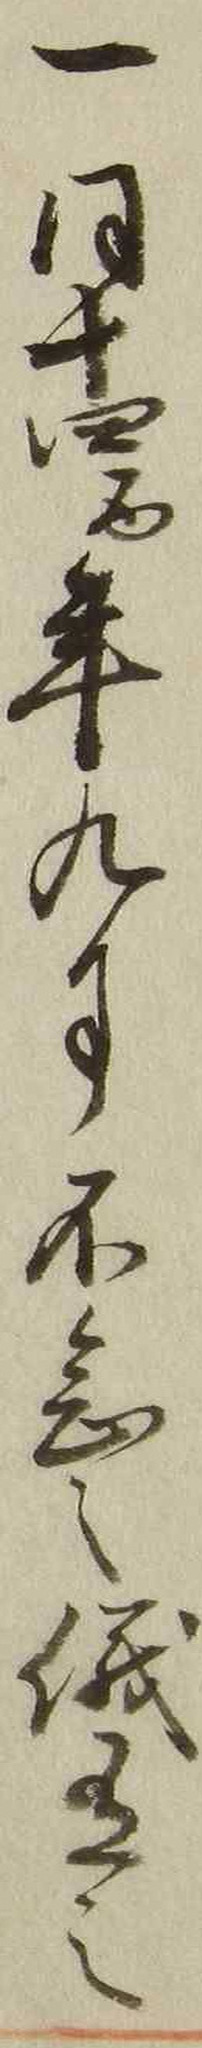一同十四酉年九月不念之儀有之
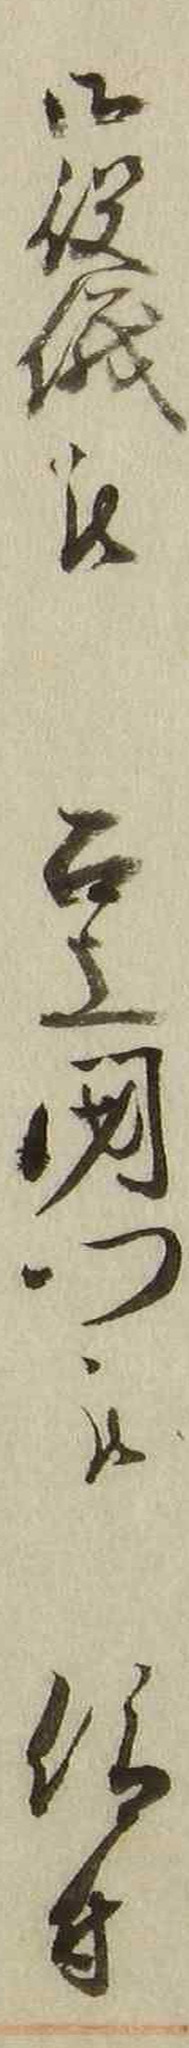御役儀被召上閉門被仰付
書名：諸士系譜　巻之27　い之部27
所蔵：会津若松市立会津図書館
